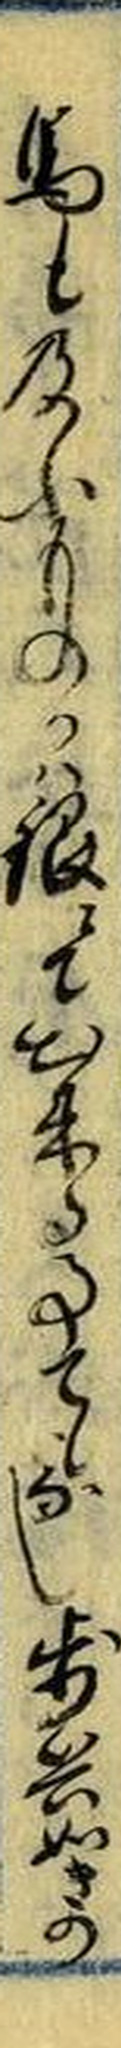馬も及ふものかは銀にて出来る事てもなし歩兵如きの
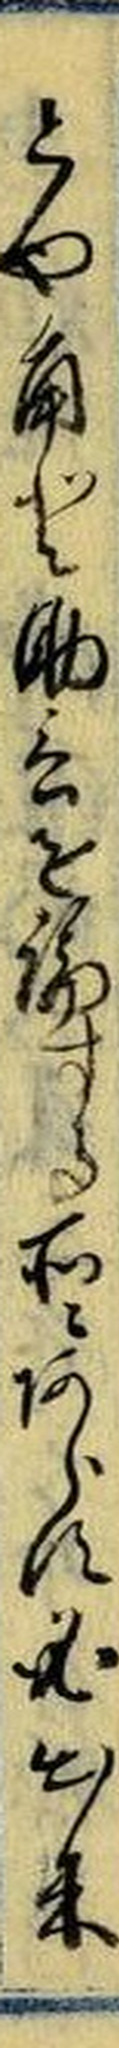とや角と助言を論する所にあらす必出来
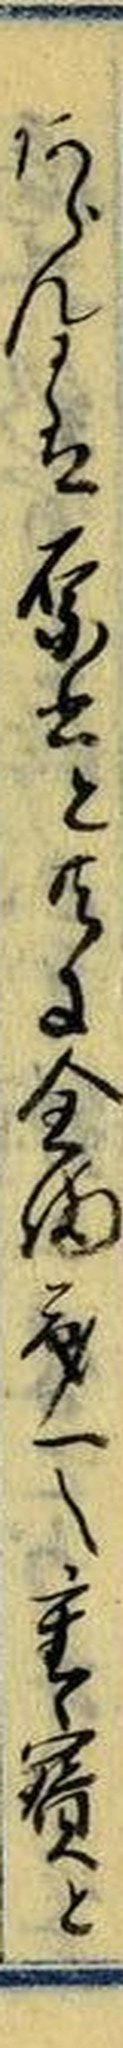あらんには原書と共に金満第一之重宝と
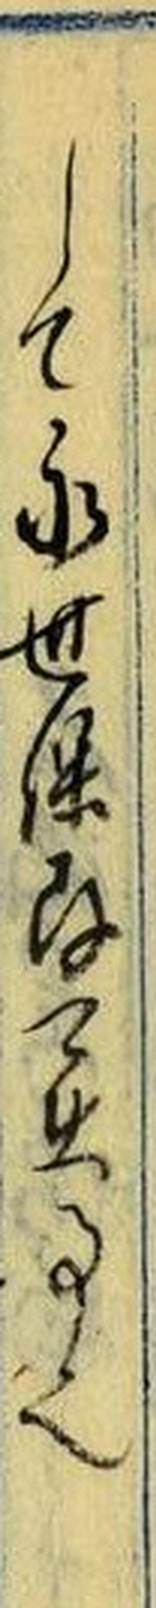して永世保存可在事也
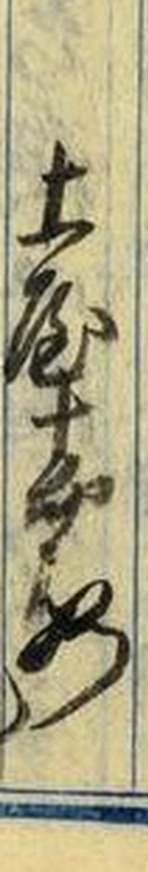土屋十郎右衛門
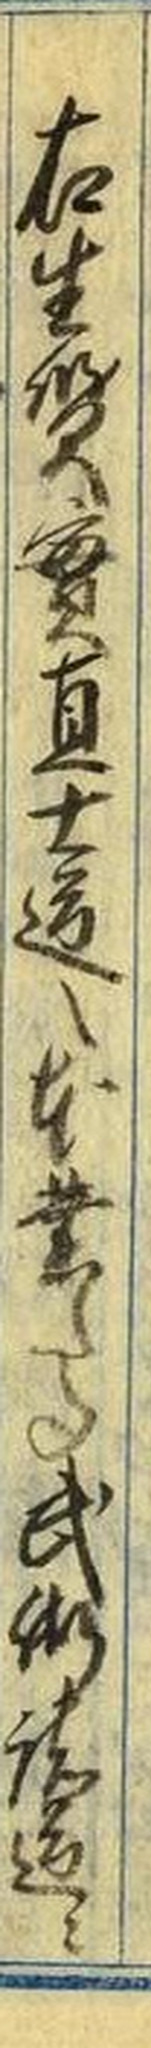右性質実真士道之本業たる武術諸道に
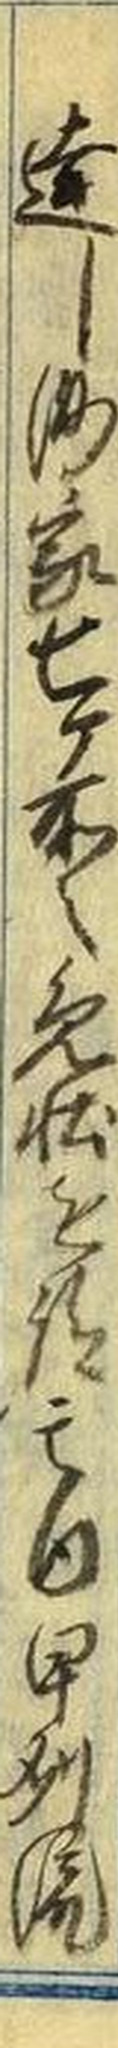達し師家七ヶ所之免状を請其内甲州流
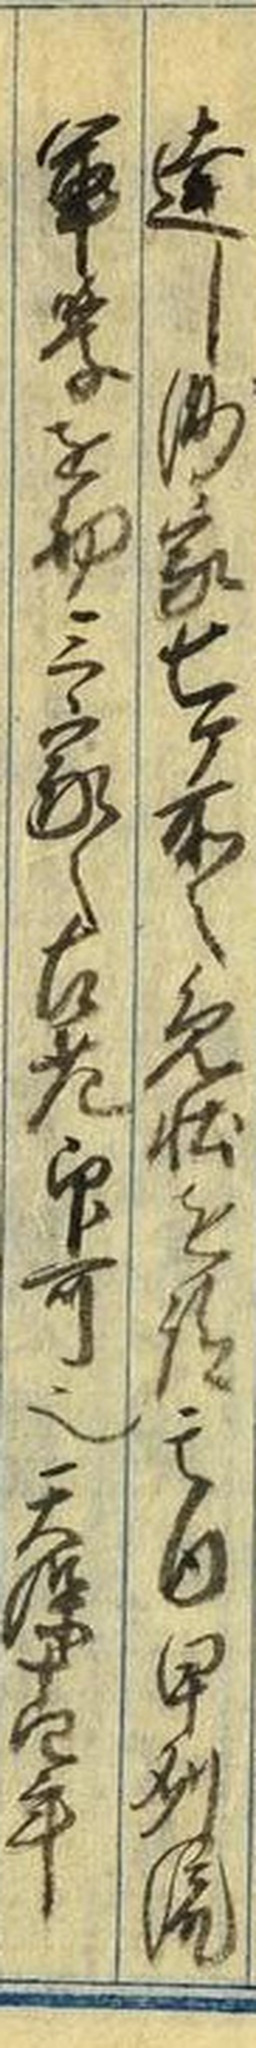軍学を初め三家之古老印可也天保十四年
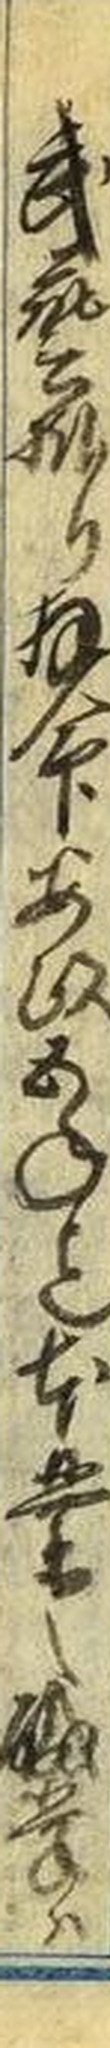武芸掛り拝命安政五年迄本業之職業は
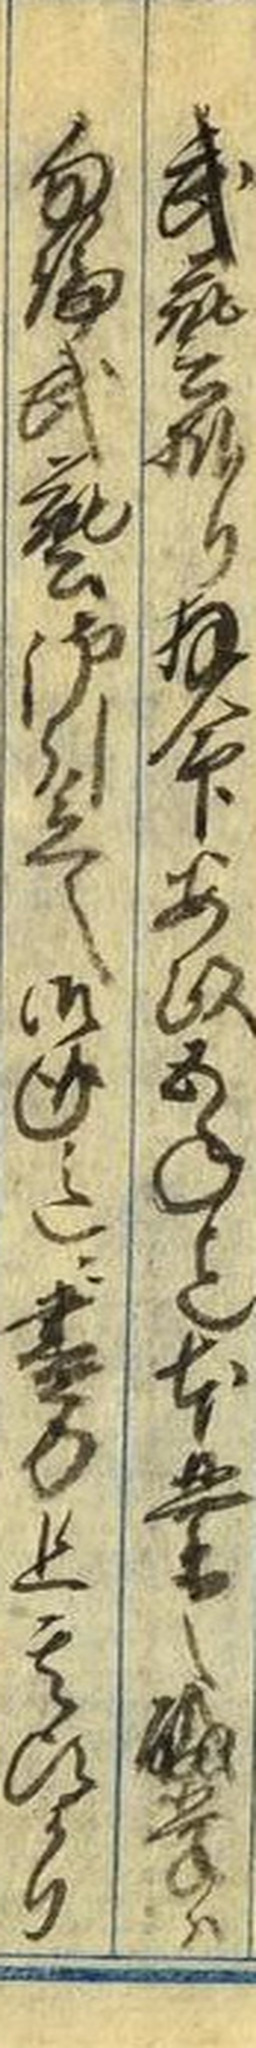勿論武芸御引立之御趣意に尽力且其頃より
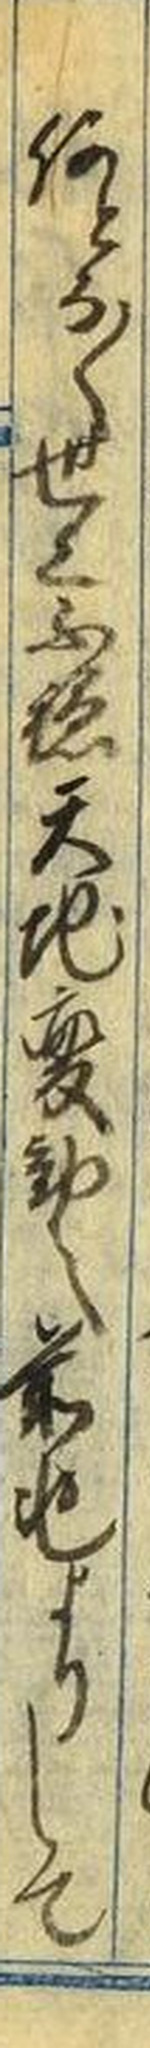何となく世上不穏天地変動之前兆よりして

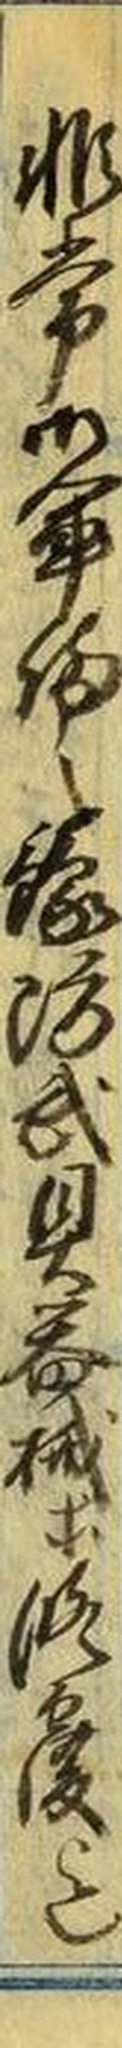非常御軍備之予防武具器械等修覆迄
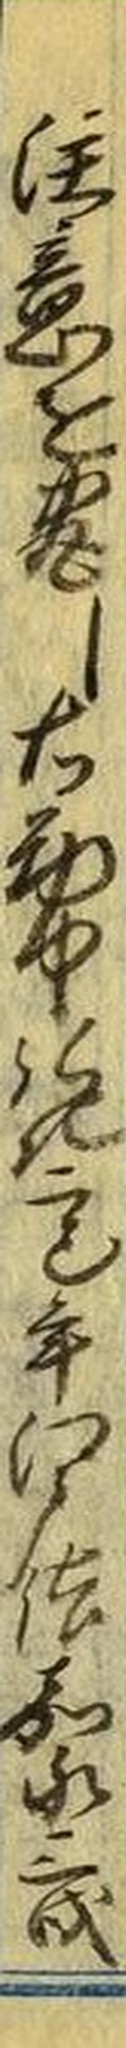注意を尽し右勤中弘化二巳年江戸詰嘉永三戌
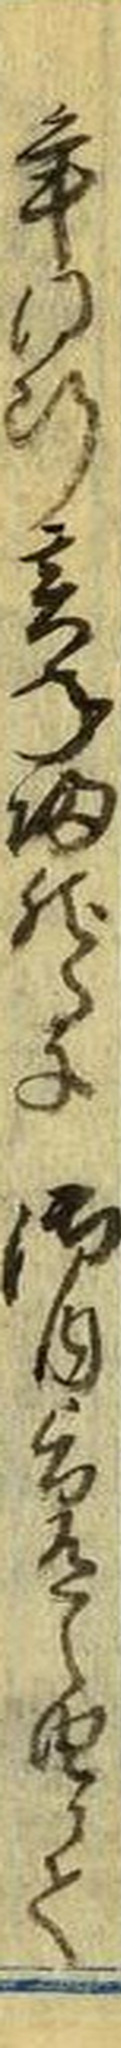年同断亥年帰然るに御内旨有之由にて
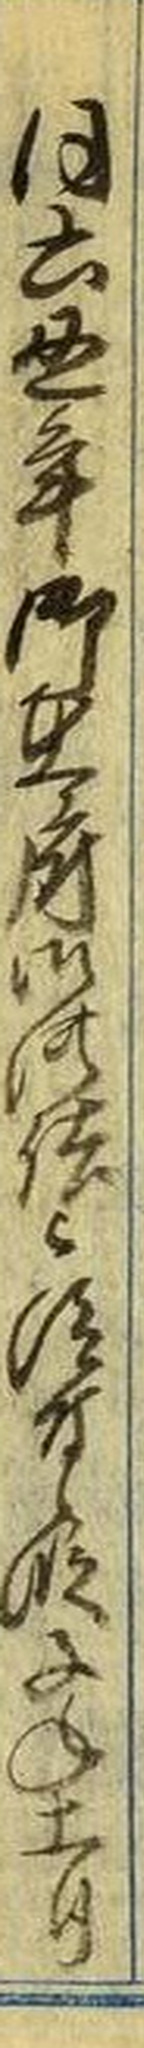同六丑年御在府御供詰被仰付候段子年十一月
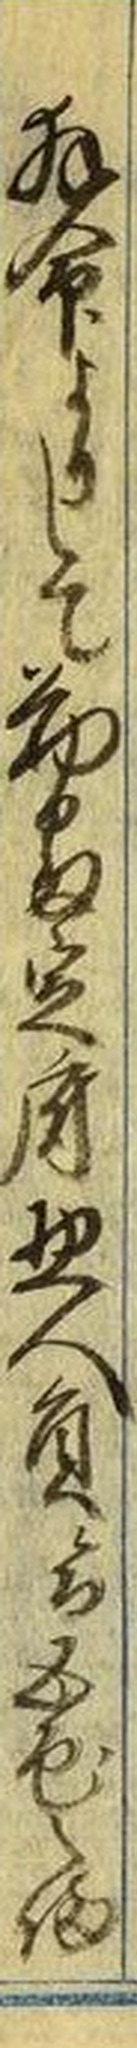拝命よりして勤番定府惣人員に而五色之備
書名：温古集 四巻
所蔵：福井県文書館 Fukui Prefectural Archives
